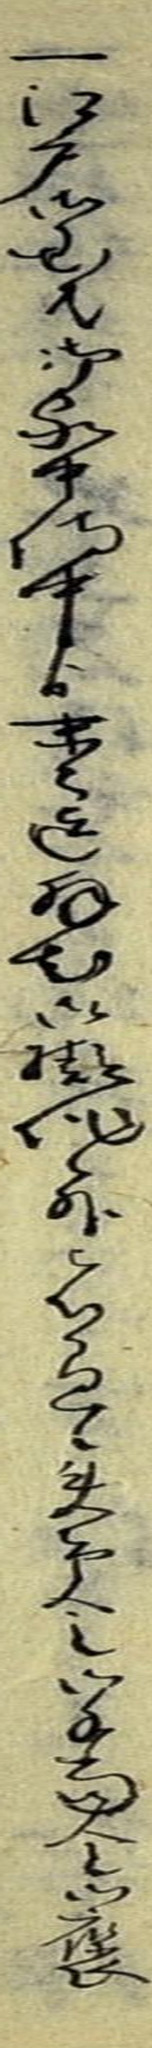一江戸御国共五御家中侍中ゟ末々迄拝知御擬作之外被下置候失却金御手当金御褒
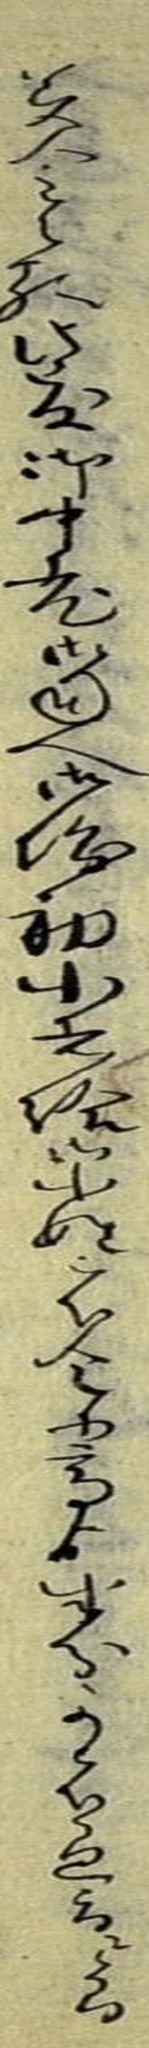美金之類此度御中老御用人御側初小者給御小姓被下金等高ゟ半分可下置旨に候間
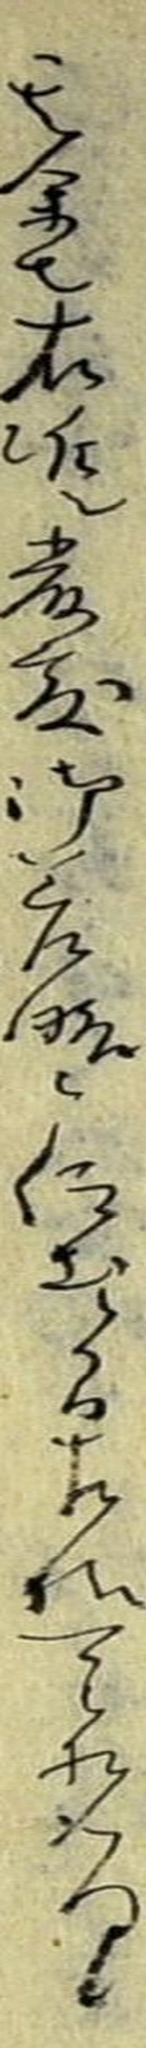其余は右准し厳敷御差略被仰出候間左様可被相心得候
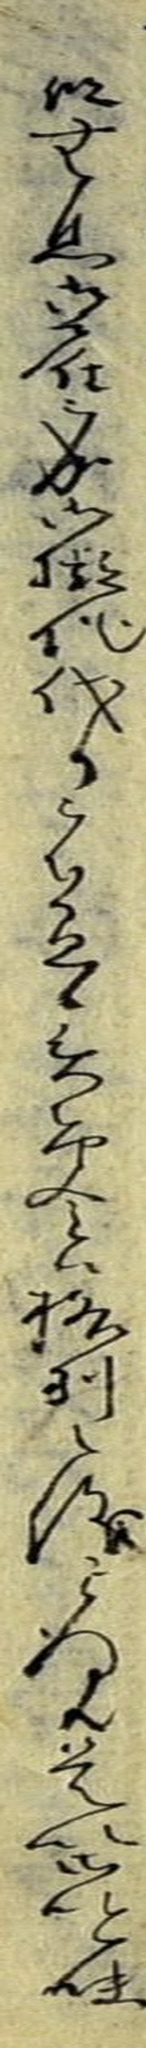但無息御雇被成御擬作代り被下置候失却金は格別之儀に候得共是以御吟味
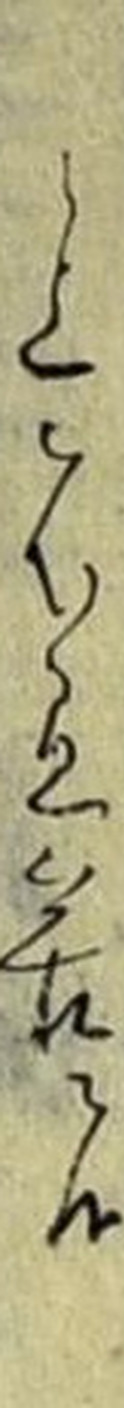之上被下置筈に候
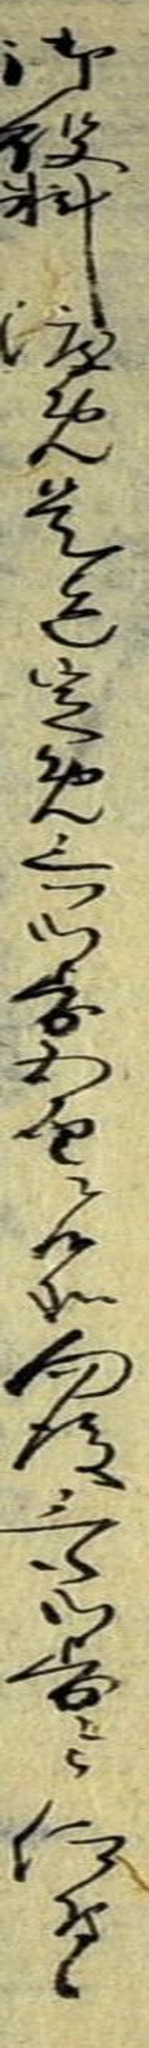一御役料渡免是迄定免三ツ弐歩五厘に候処向後三ツ弐歩に被仰付候
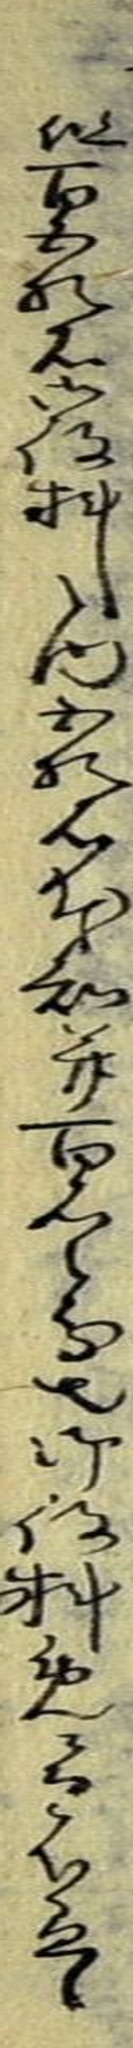但百五拾石御役料之内五拾石本知并百石之分は御役料免に而被下置候
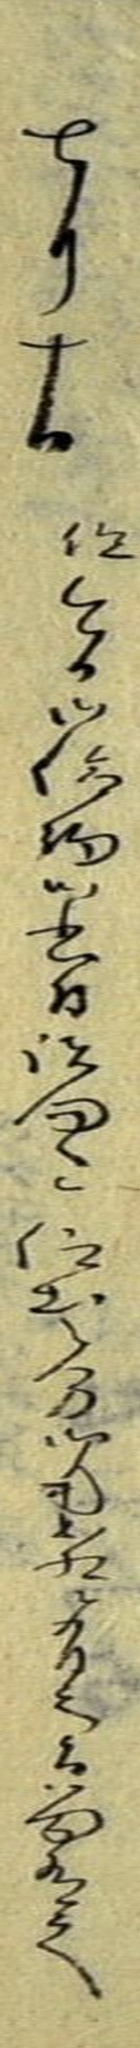七月十日但今日御倹約御書付諸向へ被仰出之分御用箱に有之旨留有之

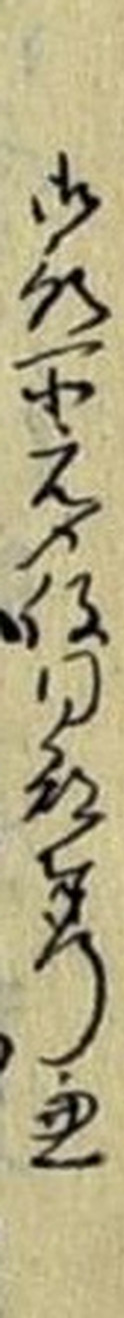御預所元〆役同郡奉行兼
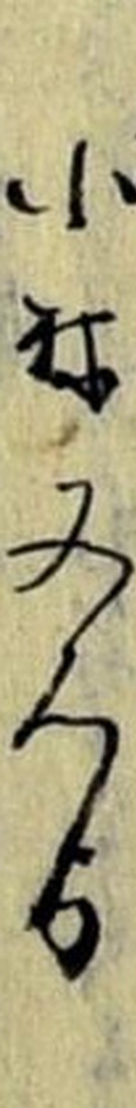小林又右衛門
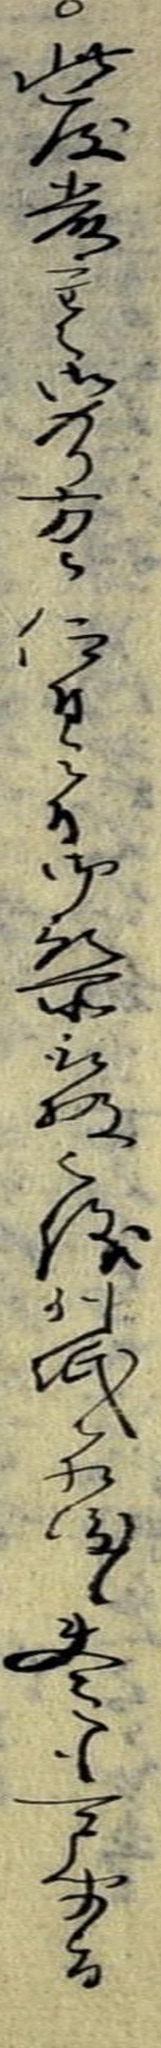〇此度厳重之御〆り方被仰付候に付御預所取扱之儀別紙被相渡候夫々へも可申聞旨
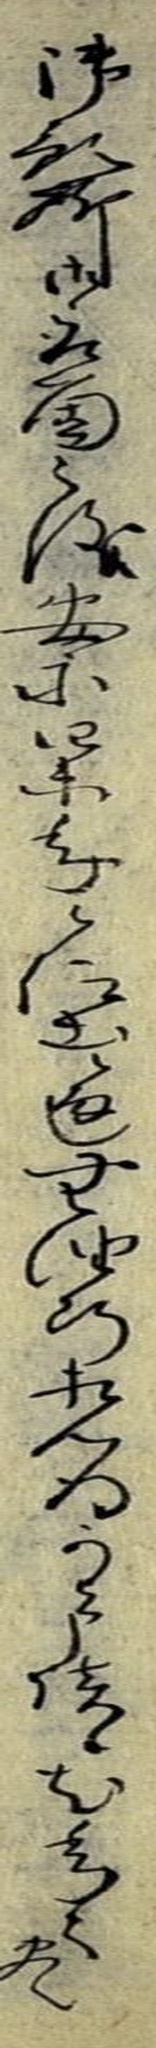御預所御取箇之儀安永四未年被仰出候通無油断相心得可被申談候尤年之豊
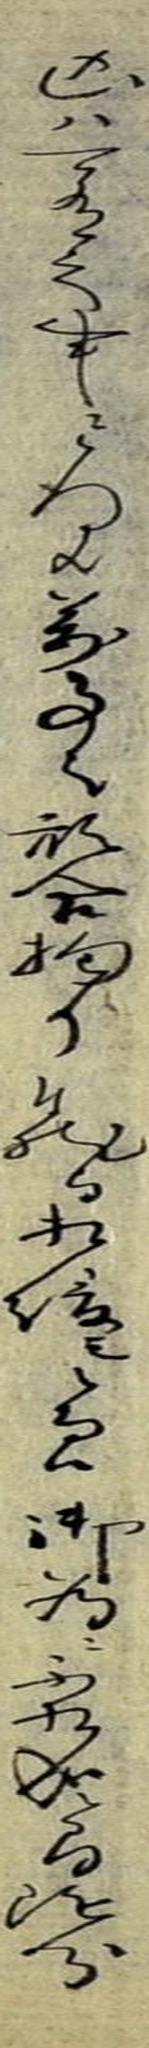凶は可有之事に候得共万事之形合拘り自然与相緩み候而は御為に不相成候間随分
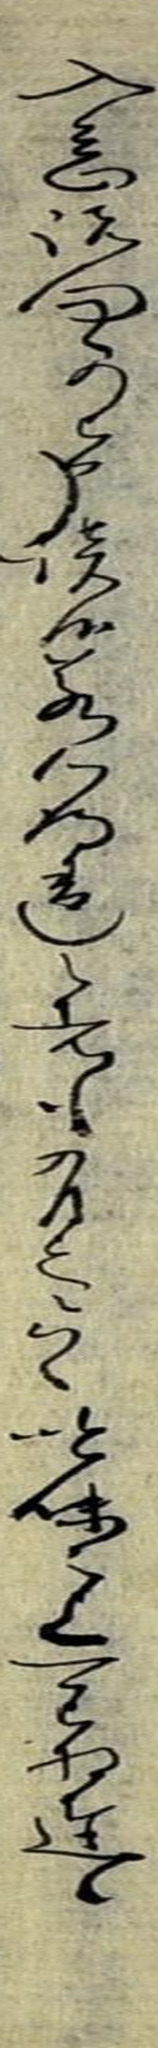入念諸向へ可被申談候若心得違之者も有之候はゝ吟味之上可被為達候
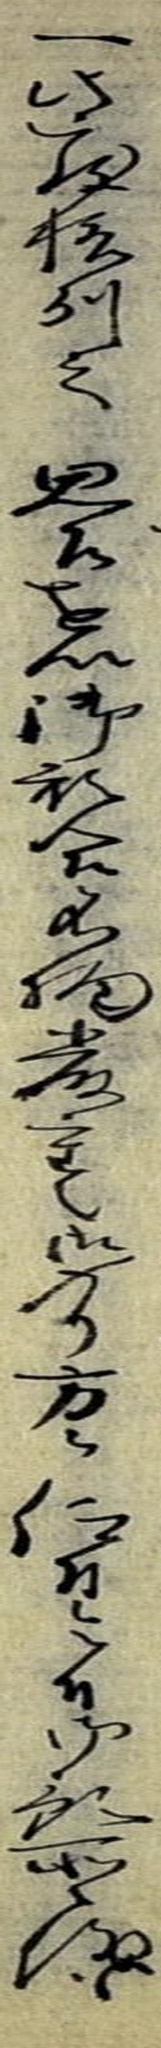一此度格別之思召を以御形合不拘厳重之御〆り方被仰付候に付御預所之儀も
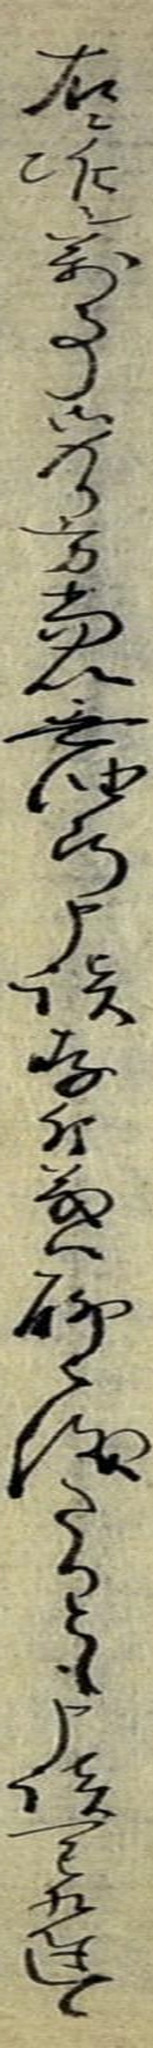右に准し万事御〆り方尚以無油断申談存付義は聊之儀たりとも申談可被相達候
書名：命令之部 二
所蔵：福井県文書館 Fukui Prefectural Archives
